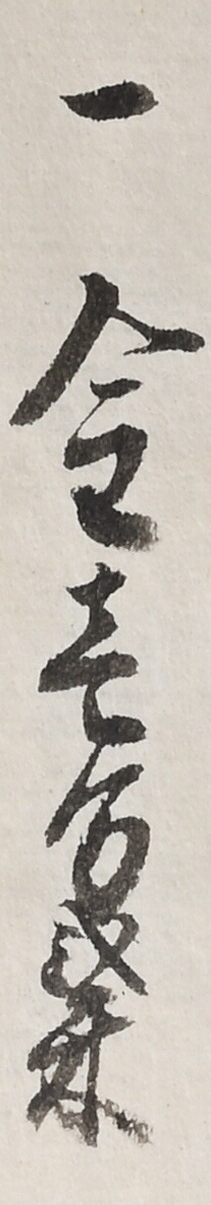一金壱分弐朱清七
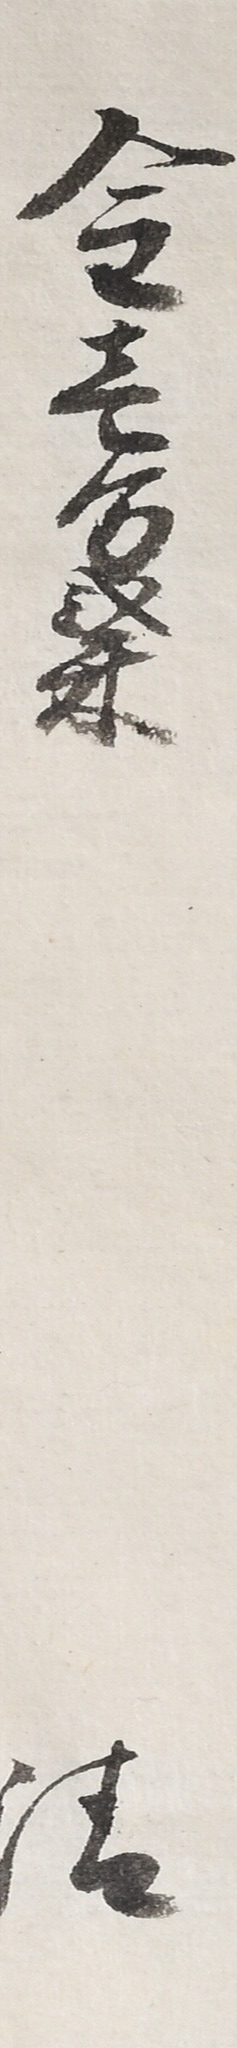一金壱分弐朱清七
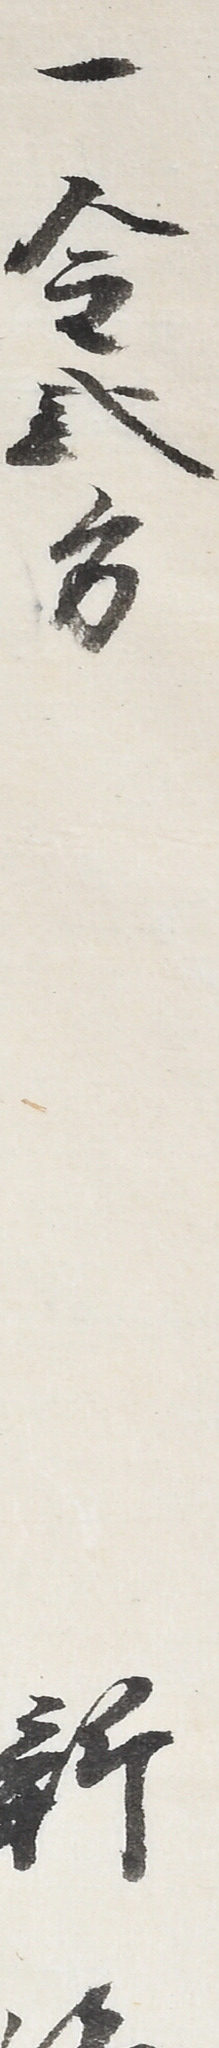一金弐分新治
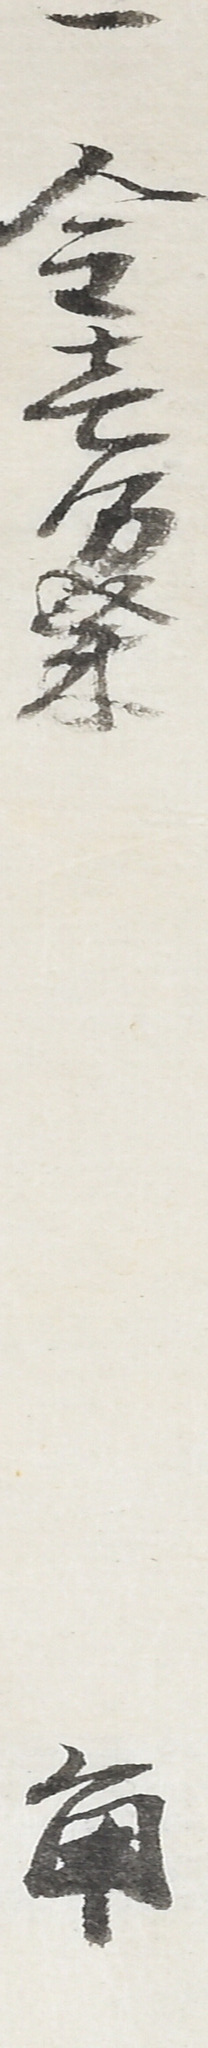一金壱分弐朱角治
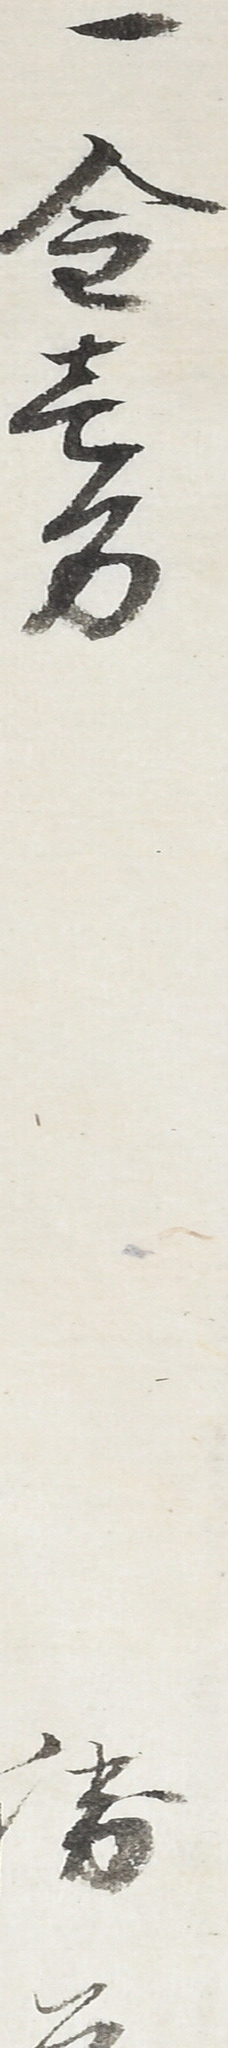一金弐分甚左衛門
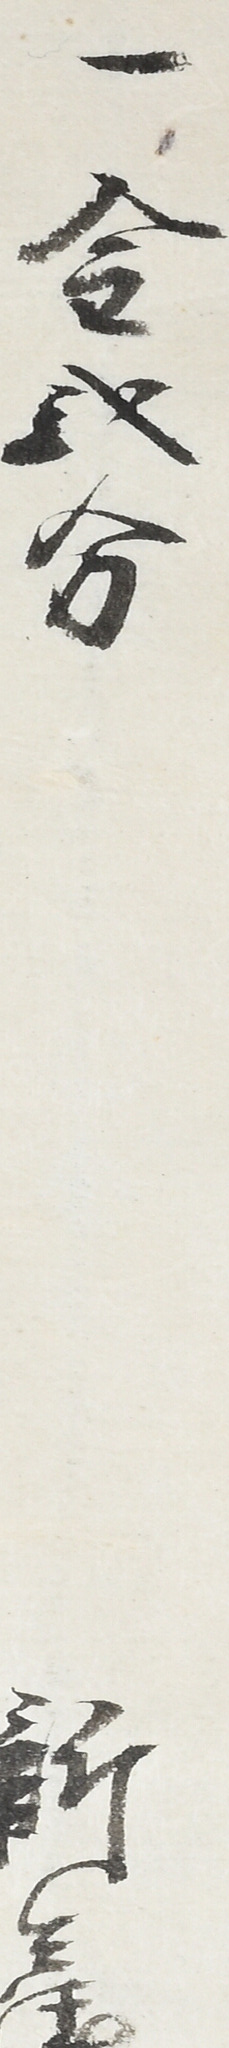一金弐分新兵衛

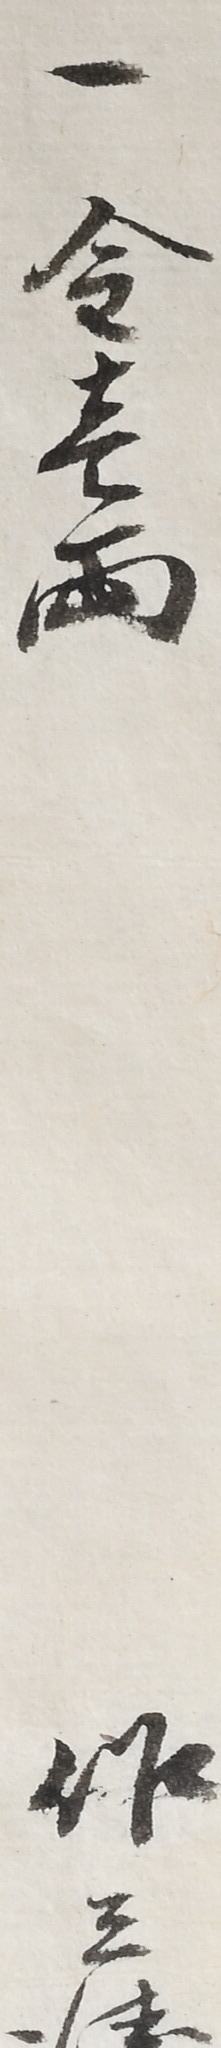一金壱両作兵衛
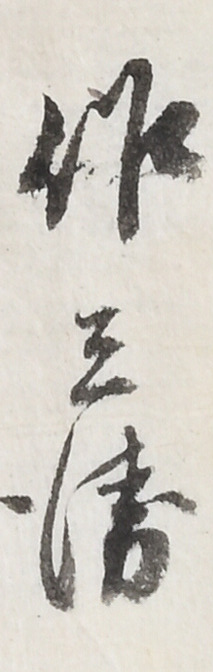半兵衛
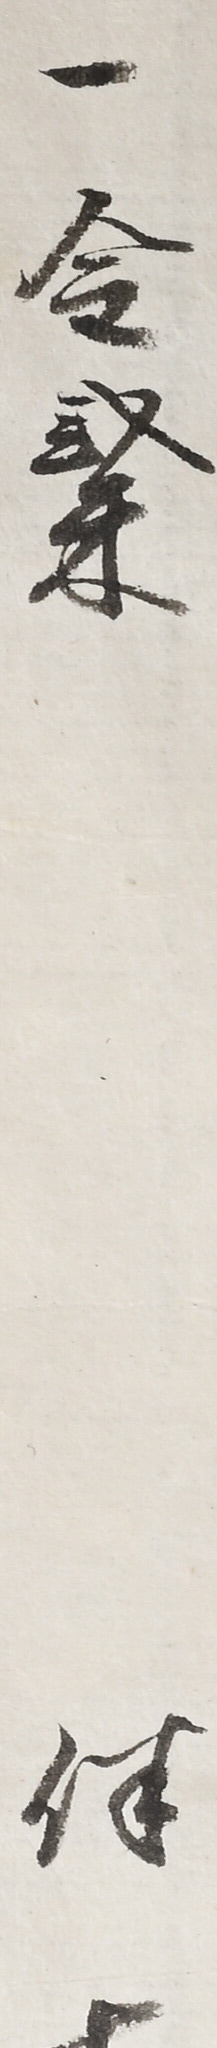一金弐朱伴七
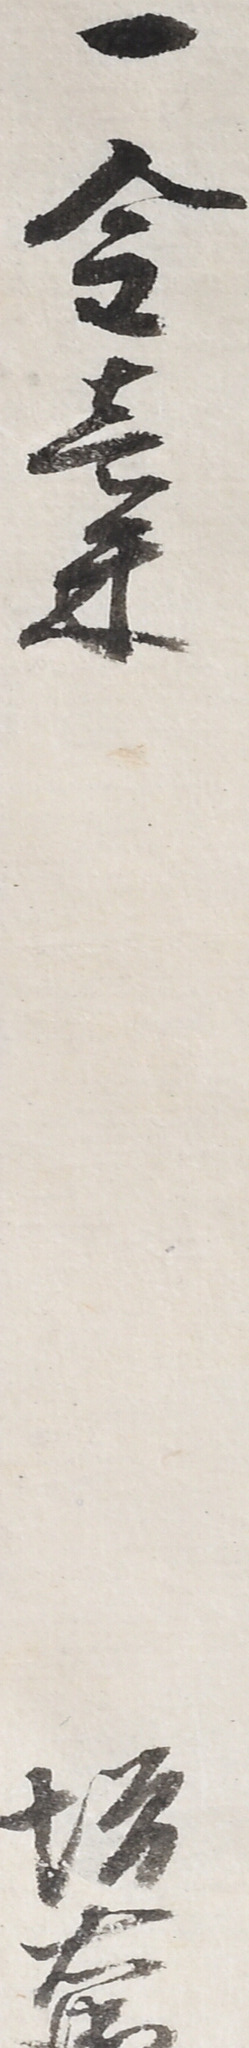一金壱朱増右衛門
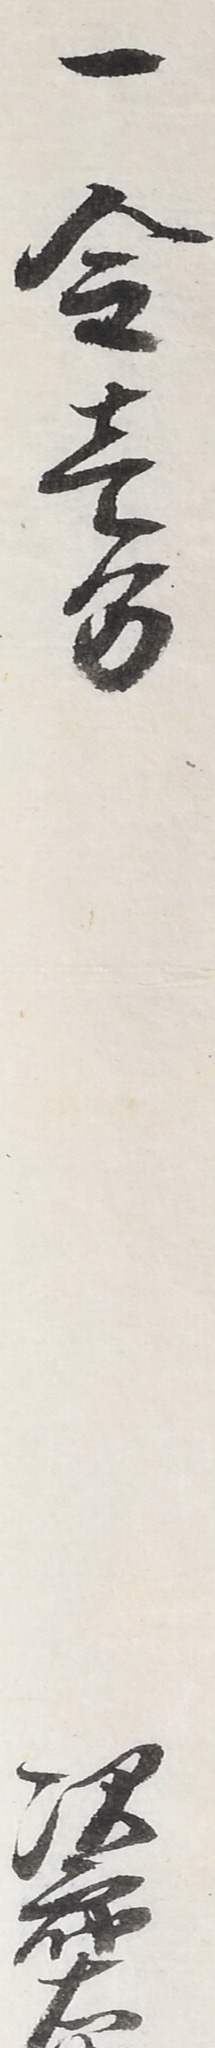一金壱分次郎右衛門
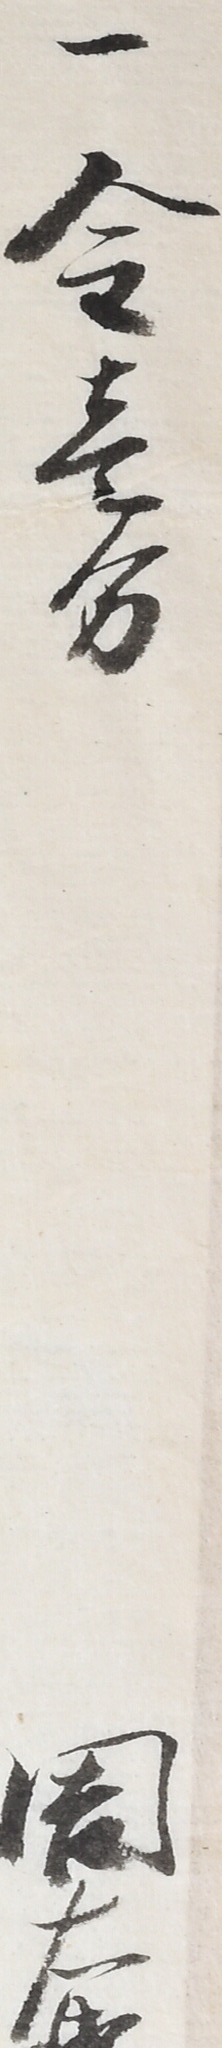一金壱分周右衛門
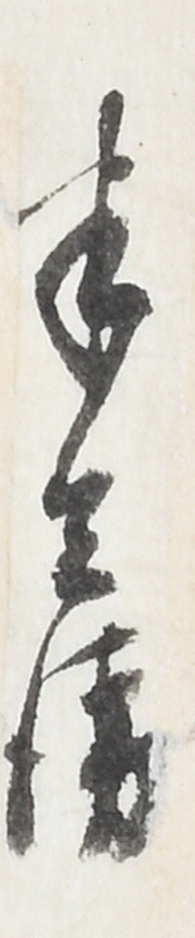半兵衛
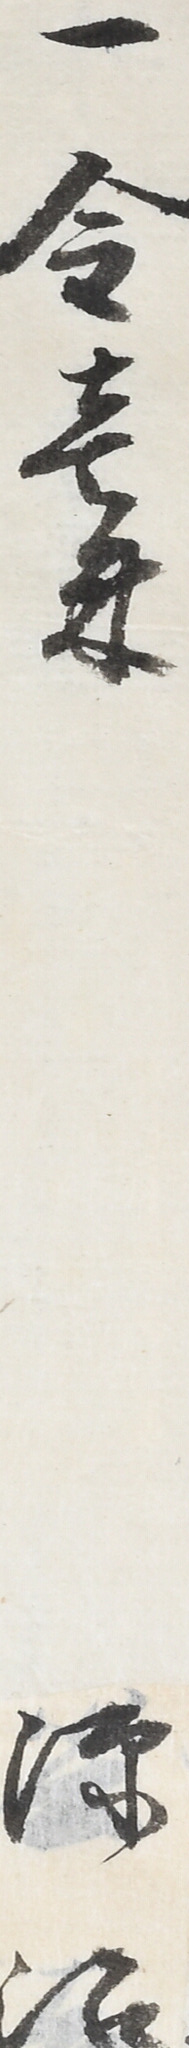一金壱朱源治
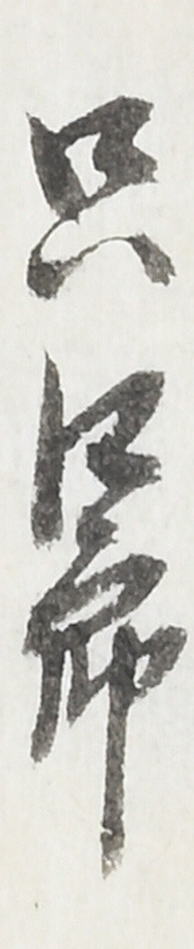只四郎
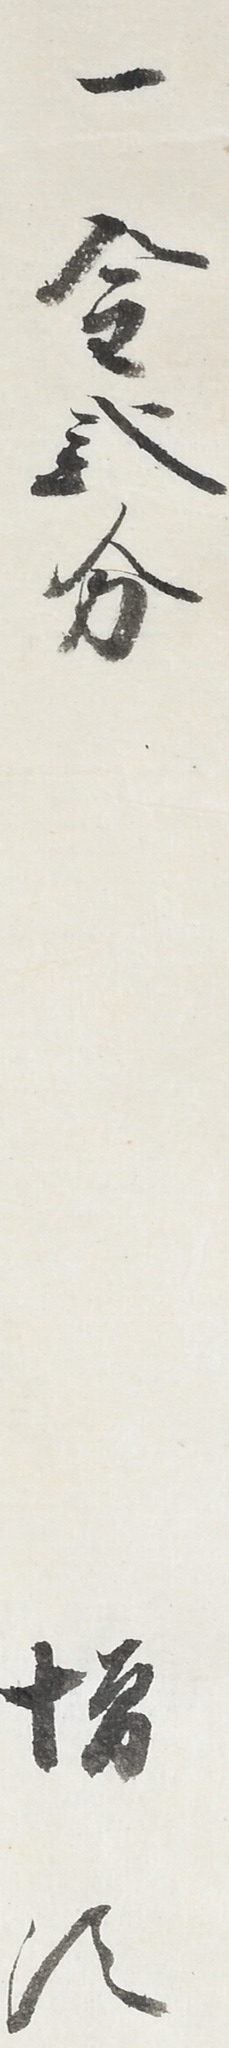一金弐分増次
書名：御拝地百五拾年御祝儀献上御目録名前
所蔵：伊那市立高遠町図書館・合同会社AMANE
